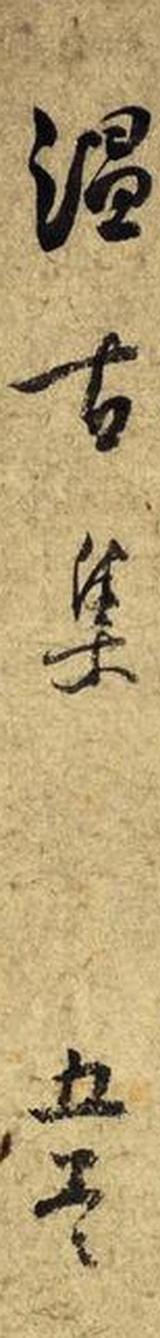温古集五巻

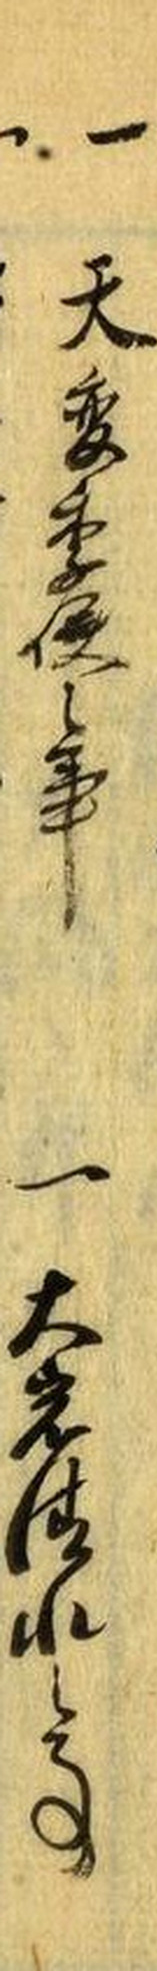一天変季候之事一大岩清水之事
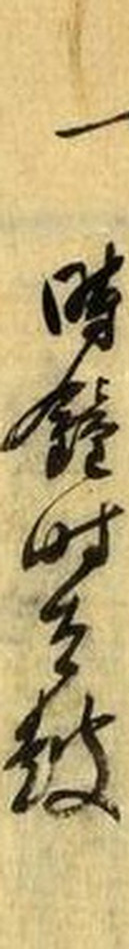一時鐘時太鼓

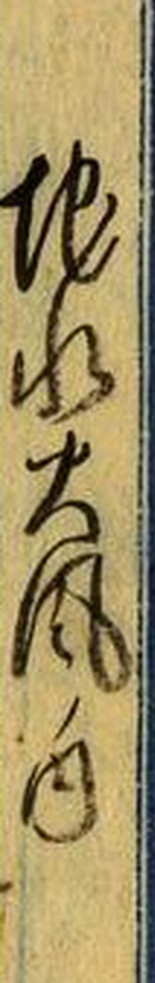地水大風ノ内
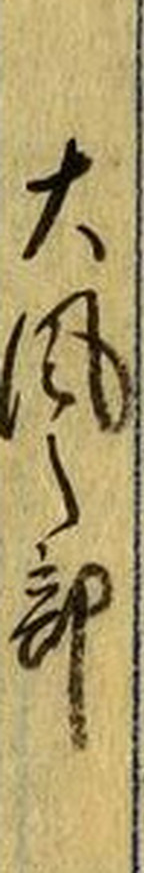大風之部
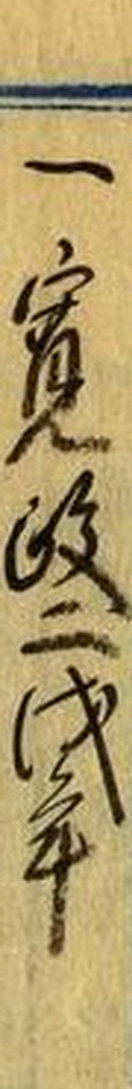一寛政二戌年
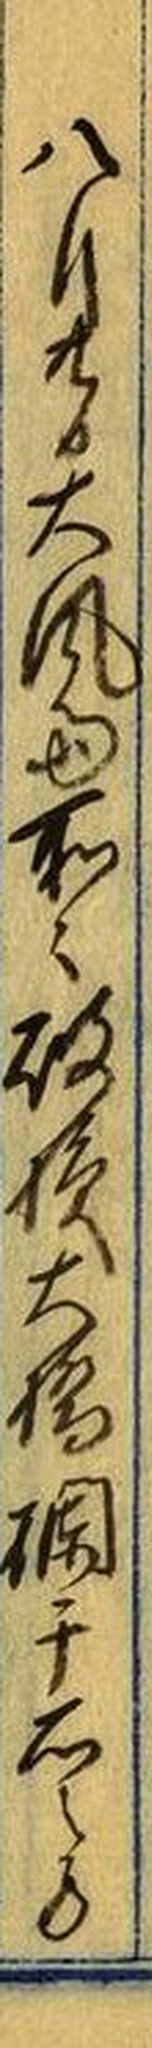八月廿日大風雨所々破損大橋欄干石之方
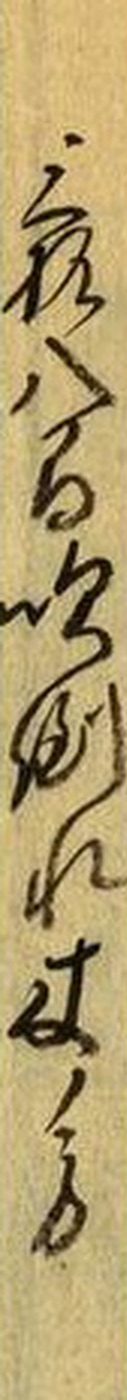三拾八間吹倒れ木ノ方
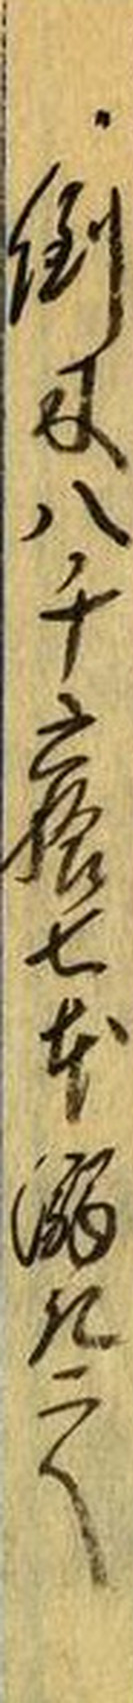倒木八千六拾七本溺死二人
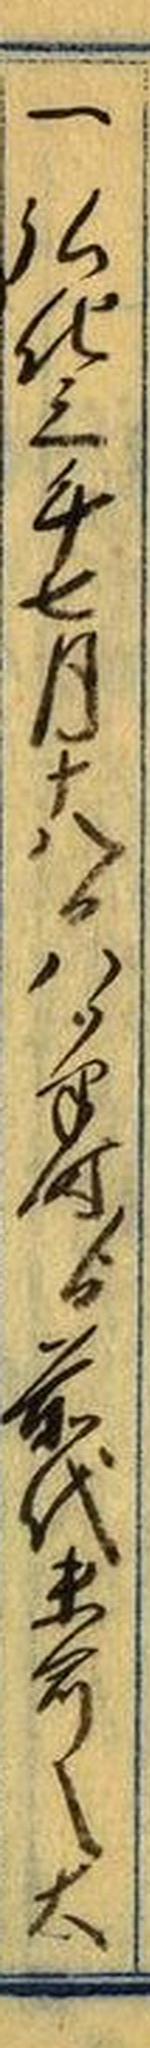一弘化三年七月十八日八ツ半時ゟ前代未聞之大
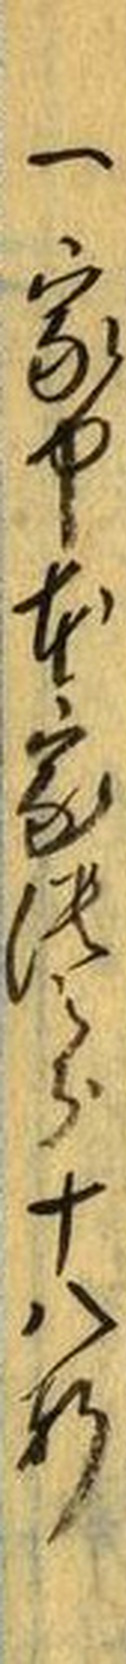一家中本家潰之分十八軒

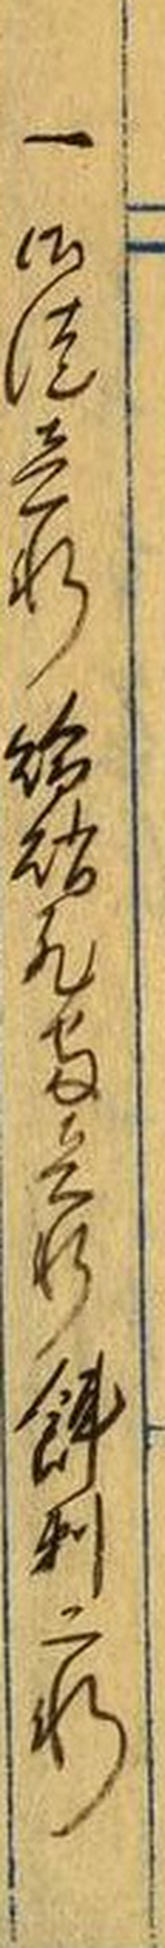一御徒壱軒焔硝蔵番壱軒餌刺二軒
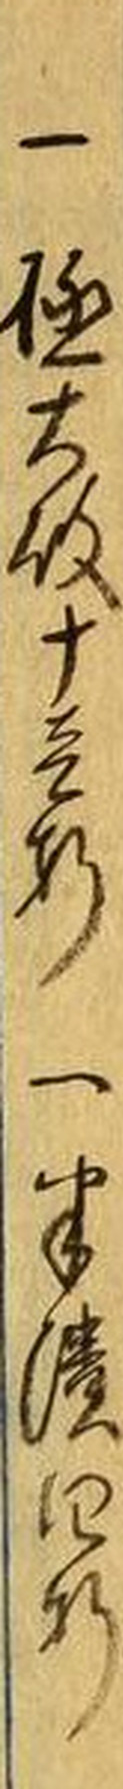一極大破十壱軒一半潰四軒
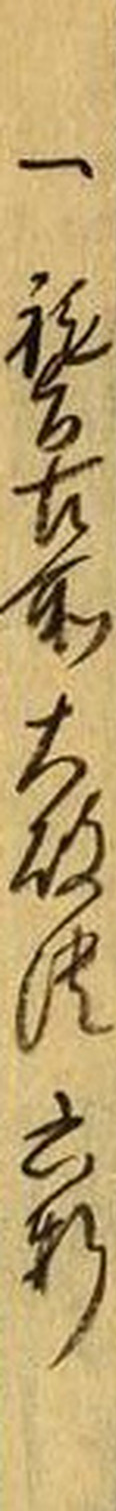一稽古所大破潰六軒
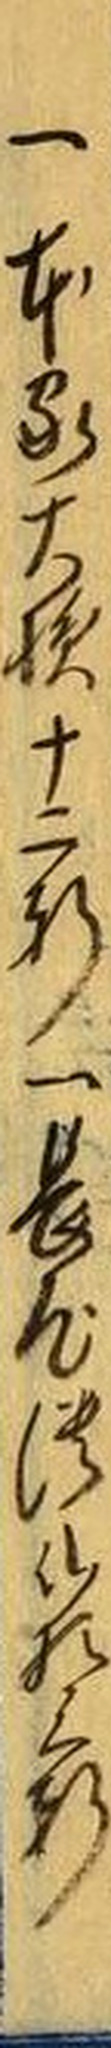一本家大損十二軒一長屋潰弐拾三軒
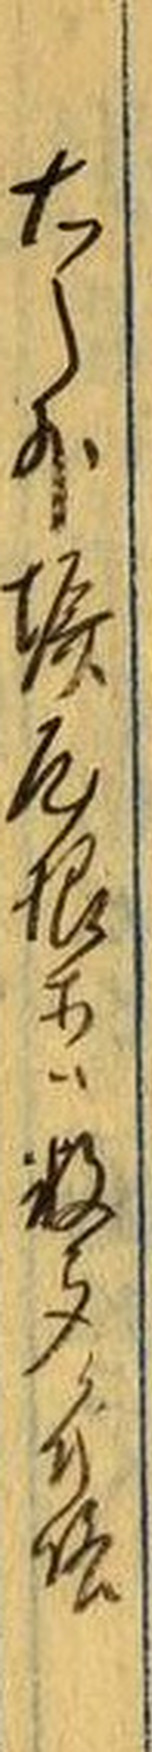右之外塀屋根等ハ数多ニ付略
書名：温古集 五巻
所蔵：福井県文書館 Fukui Prefectural Archives
